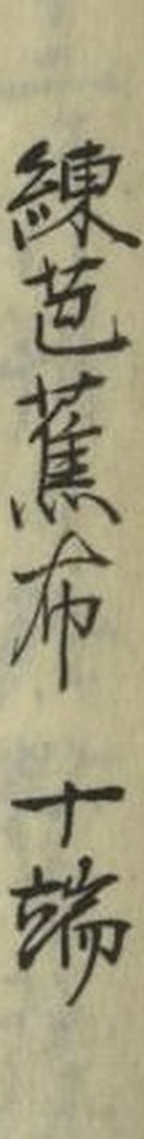練芭蕉布十端
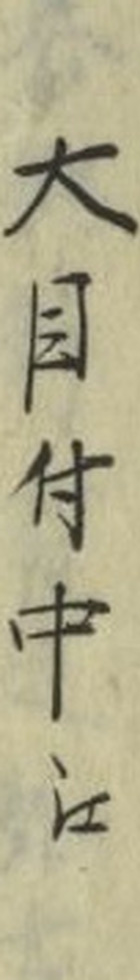大目付中え
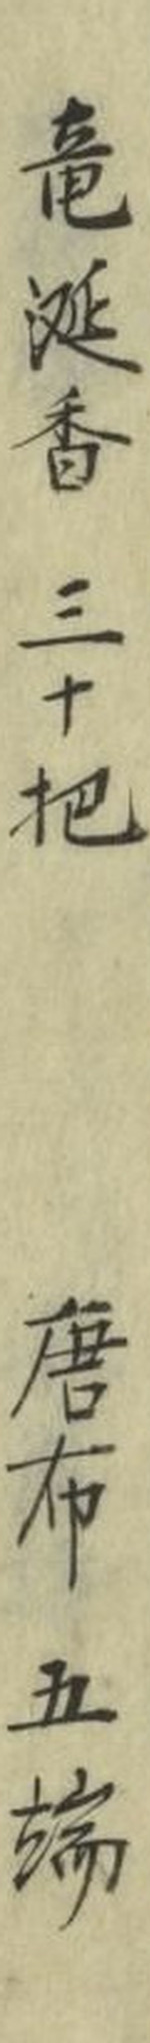竜涎香三十把唐布五端

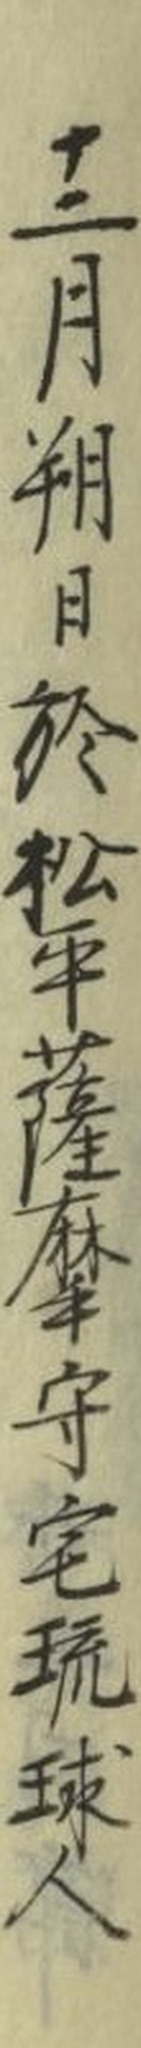十二月朔日於薩摩守宅琉球人
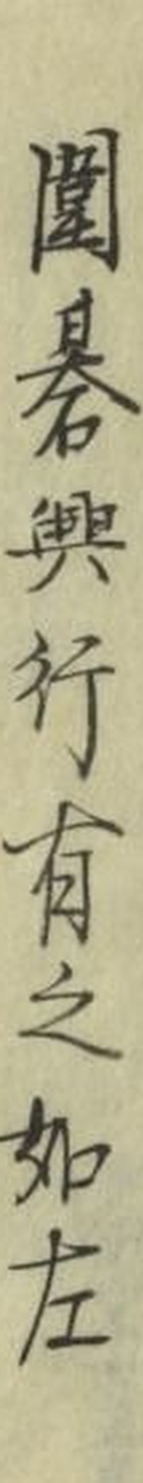囲碁興行有之如左
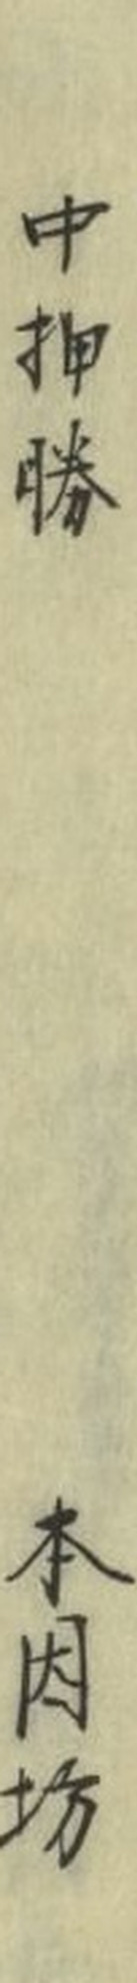中押勝本因坊
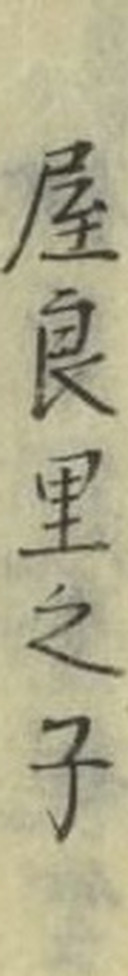三ツ置屋良里之子
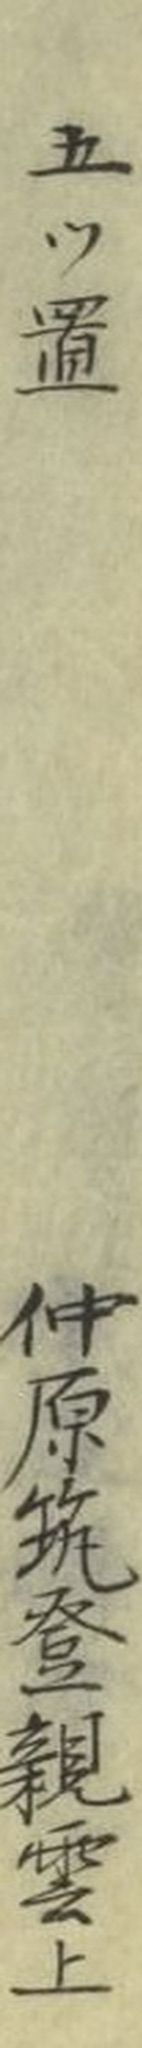五ツ置仲原筑登親雲上
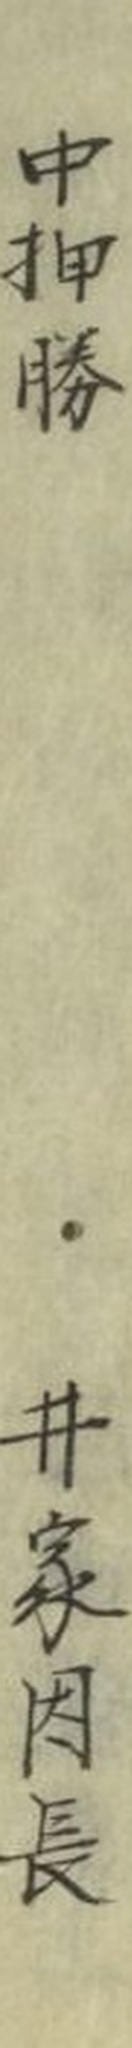中押勝井家因長
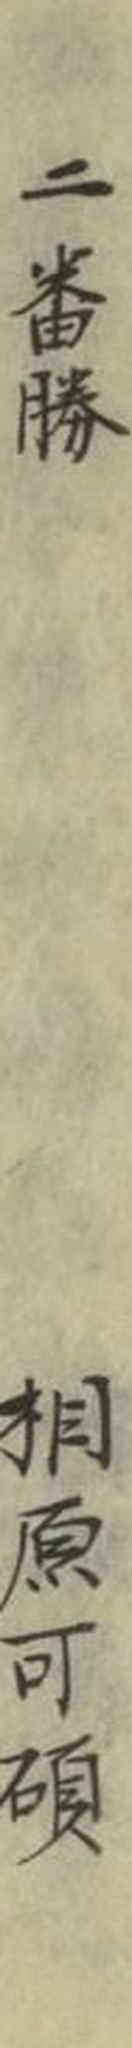二番勝相原可硯
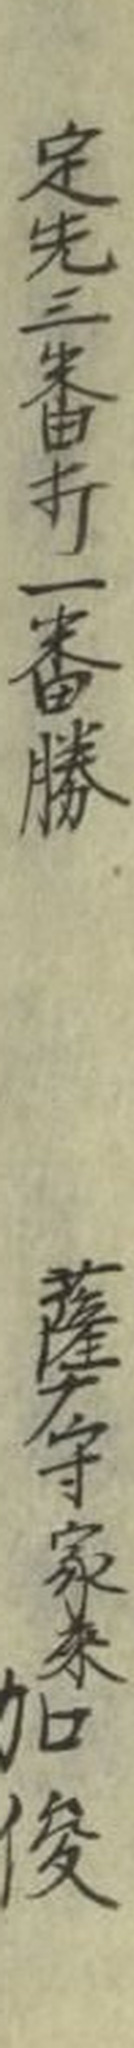定先三番打一番勝薩摩守家来加俊
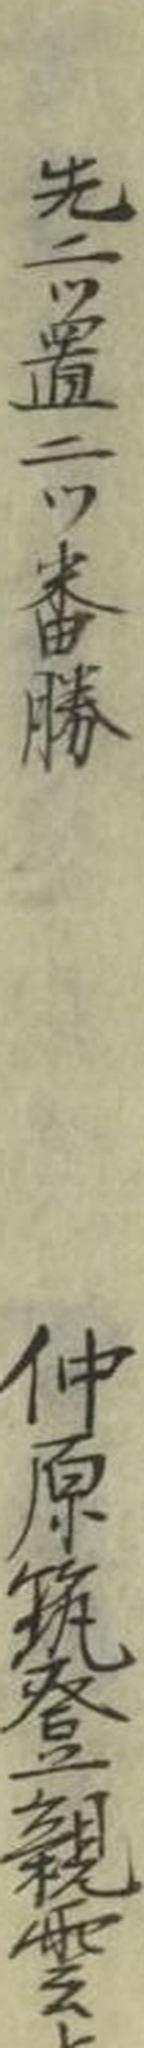先二ツ置二ツ番勝仲原筑登親雲上
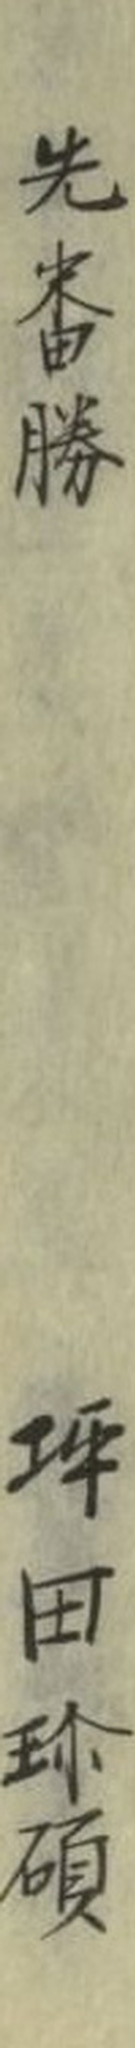先番勝坪田珍硯

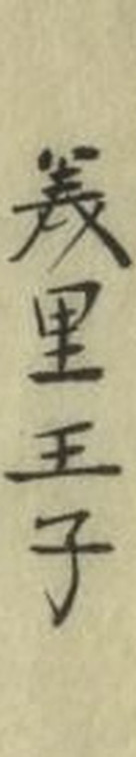美里王子
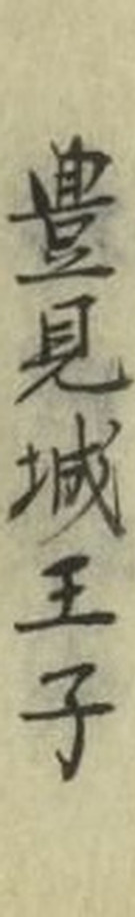豊見城王子
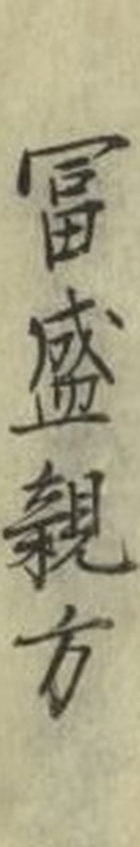富盛親方
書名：宝永七庚寅年琉球国来聘使日記
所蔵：University of the Ryukyus Library
